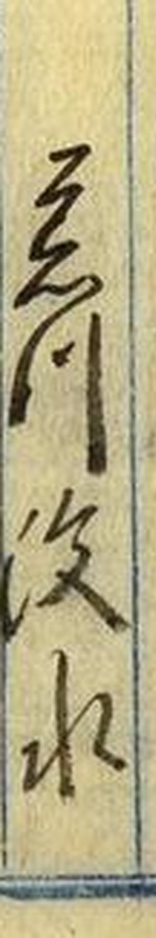荒川汶水
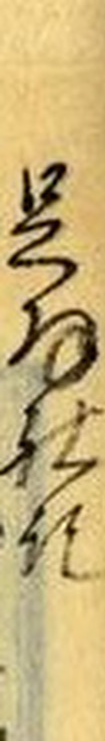「足羽社記
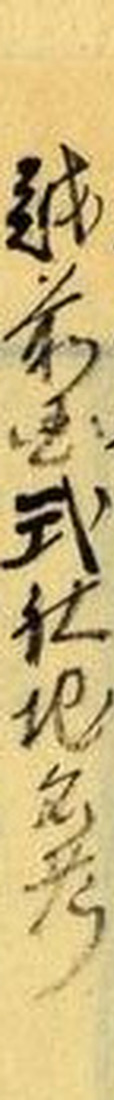越前国式社地名考
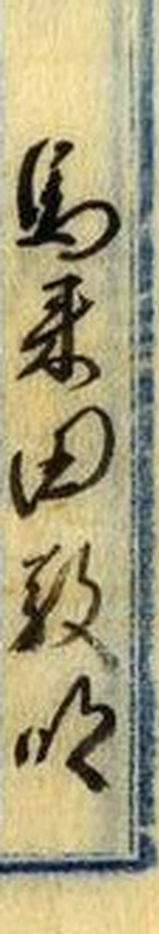馬来田敬明
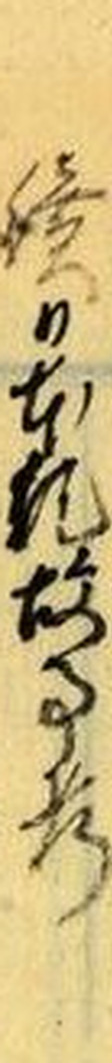続日本紀故事考
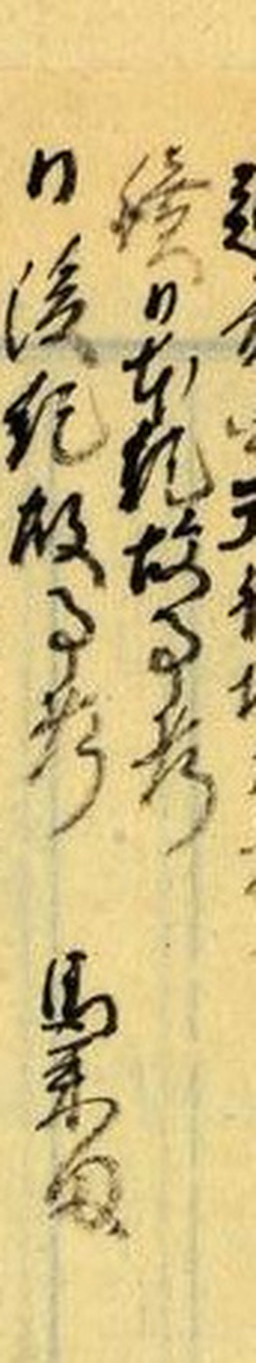同後紀故事考馬来田
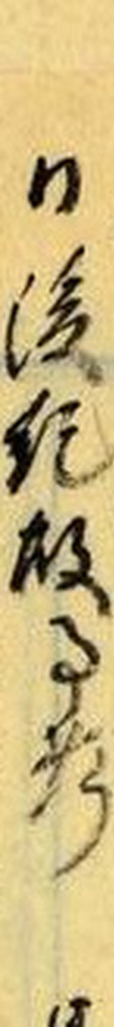続日本紀故事考
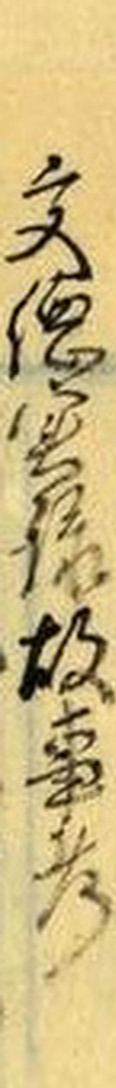文徳実録故事考
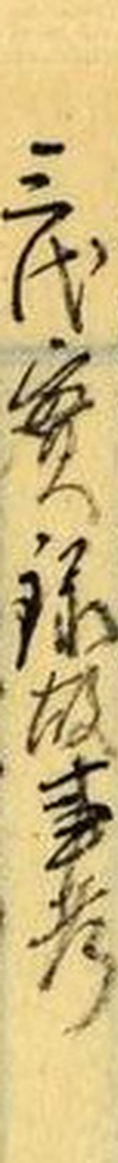三代実録故事考
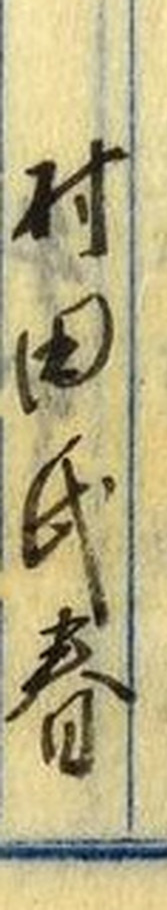村田氏春
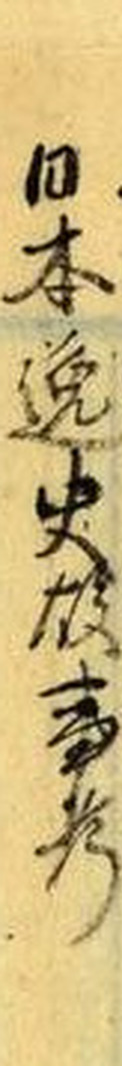日本逸史故事考」
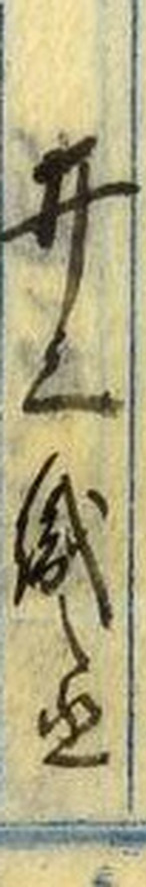井上織之丞
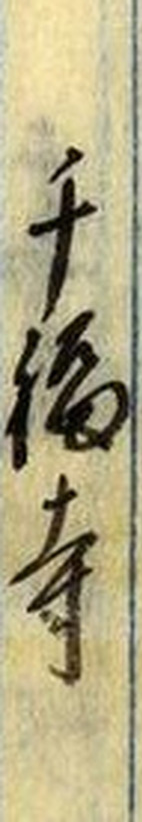千福寺

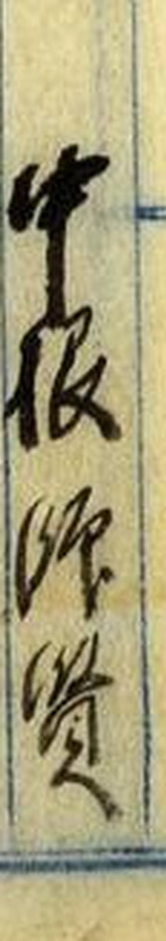中根師賢
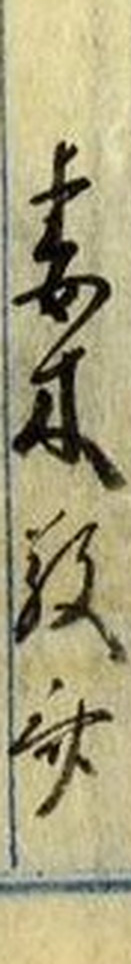妻木敬斎
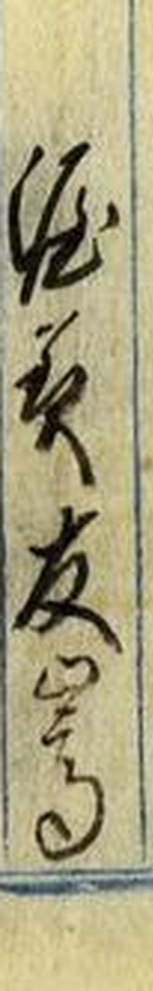渥美友嵩
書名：温古集 四巻
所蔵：福井県文書館 Fukui Prefectural Archives
